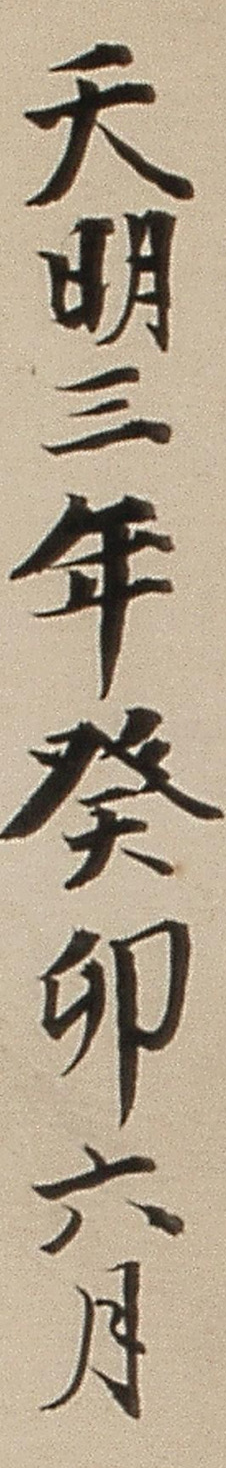天明三年癸卯六月
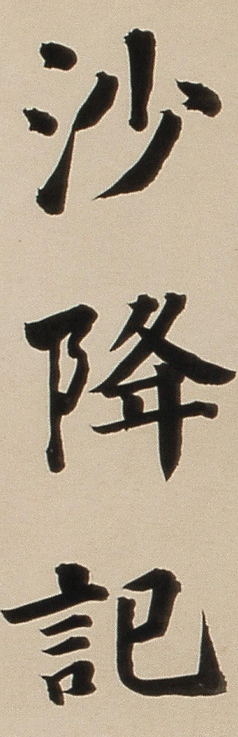沙降記
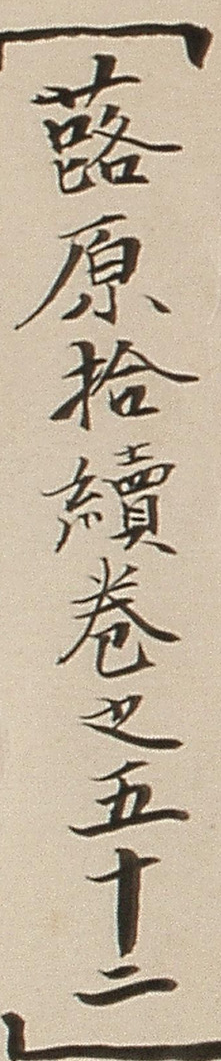[蕗原拾続巻之五十二]

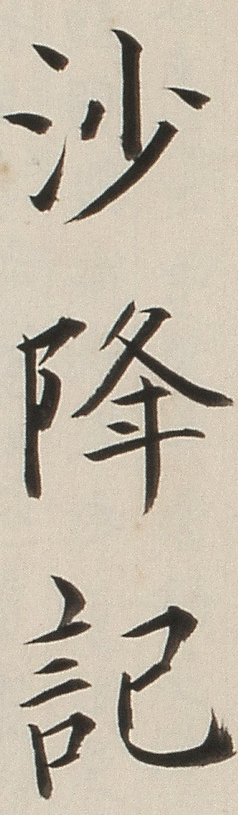沙降記

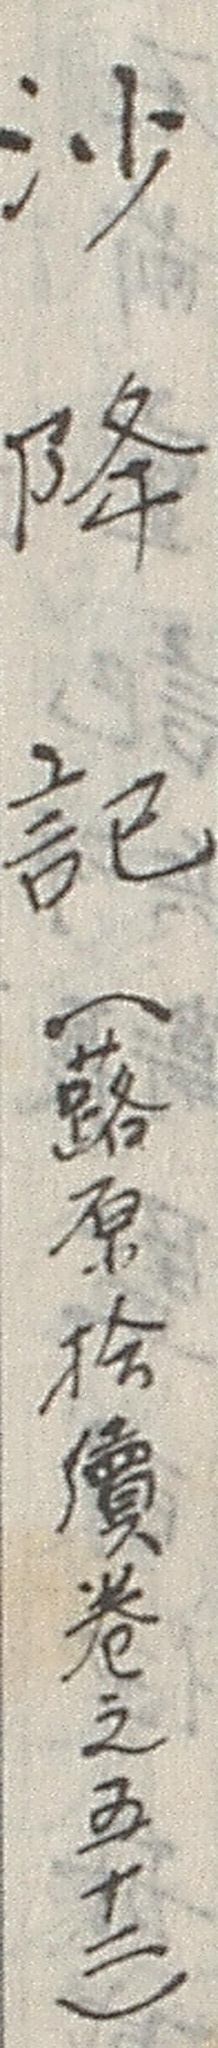沙降記蕗原拾続巻之五十二
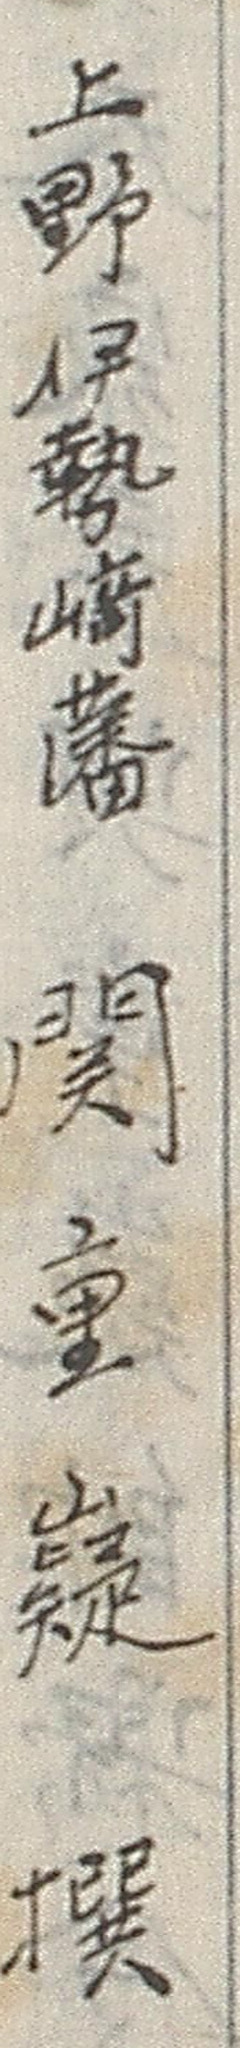上野伊勢崎藩関重嶷撰
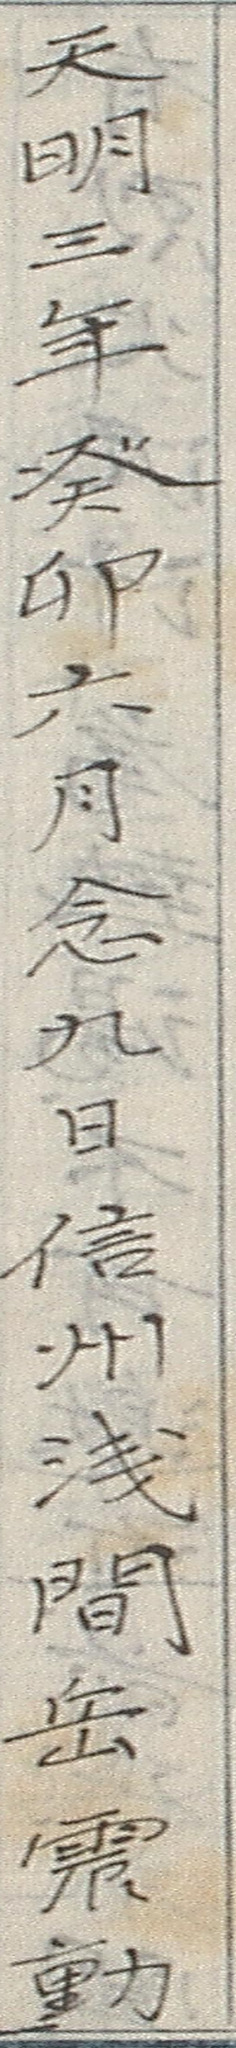天明三年癸卯六月念九日信州浅間岳震動
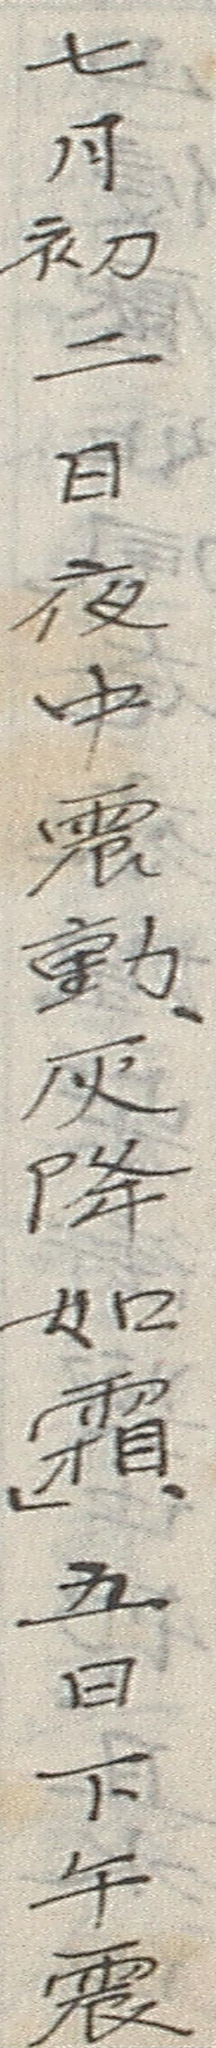七月初二日夜中震動、灰降如霜、五日下午震
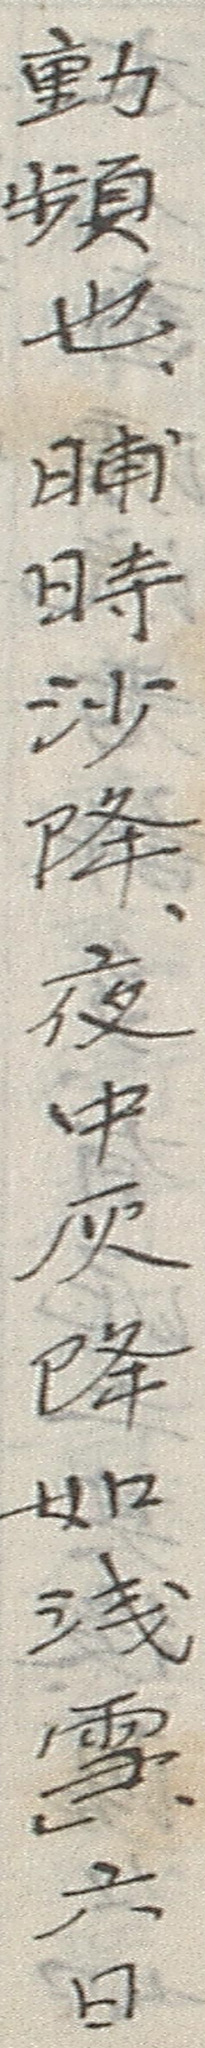動頻也、晡時沙降、夜中灰降如浅雪、六日
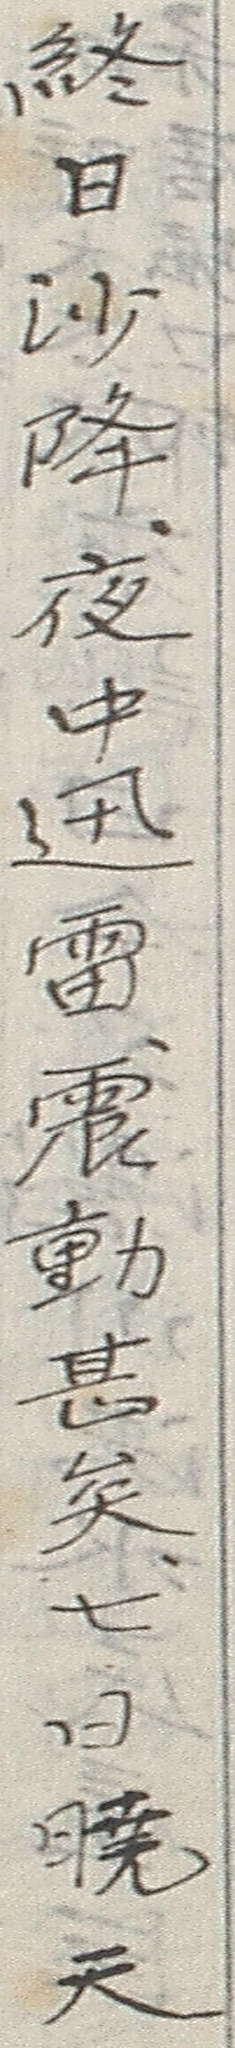終日沙降、夜中迅雷、震動甚矣、七日暁天
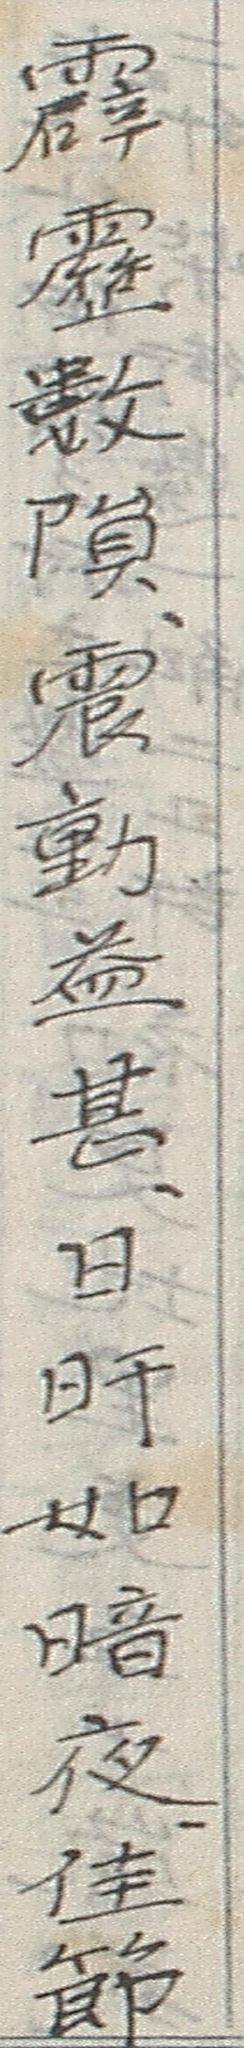霹靂数隕、震動益甚、日旰如暗夜、佳節
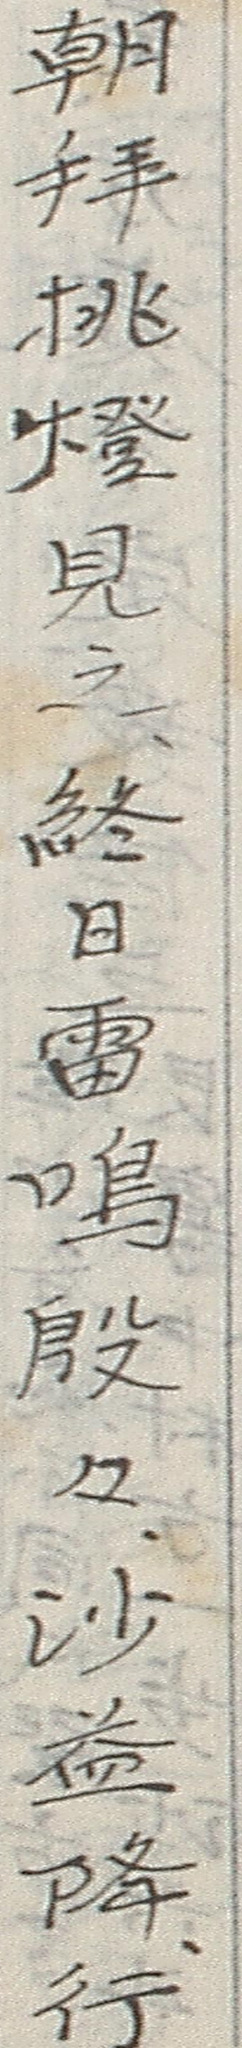朝拝桃燈見之、終日雷鳴殷々、沙益降、行
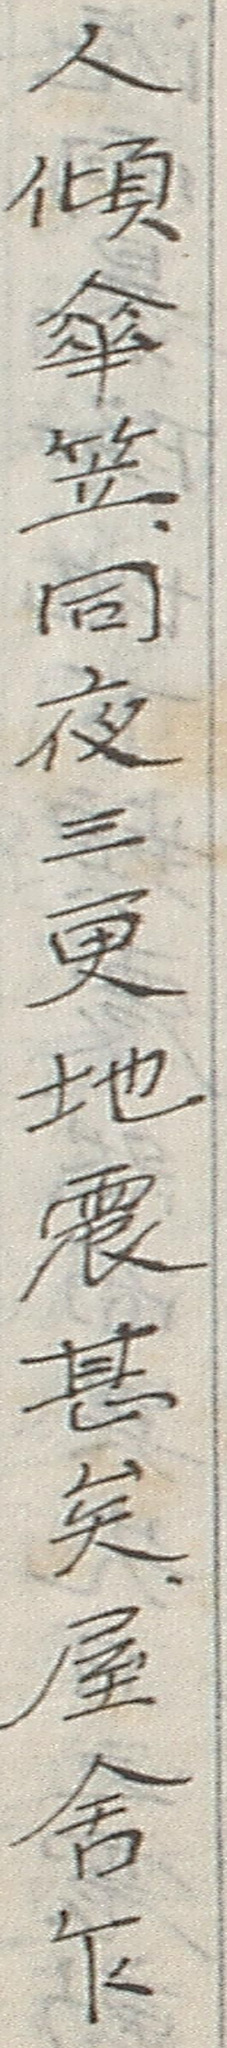人傾傘笠、同夜三更地震甚矣、屋舎乍

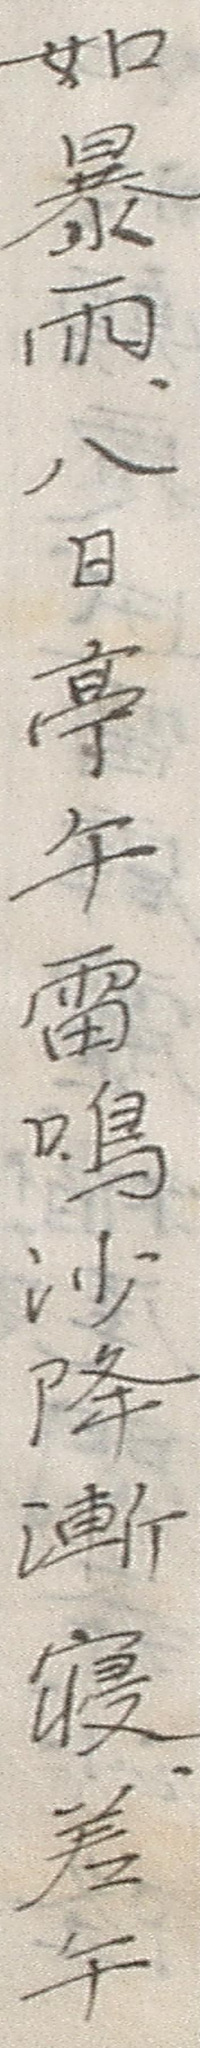如暴雨、八日亭午雷鳴沙降漸寝差午
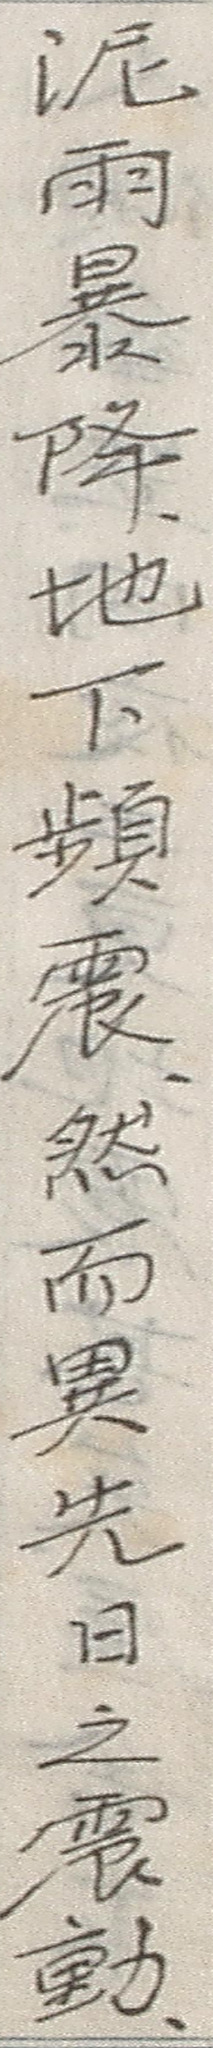泥雨暴降、地下頻震、然而異先日之振動、
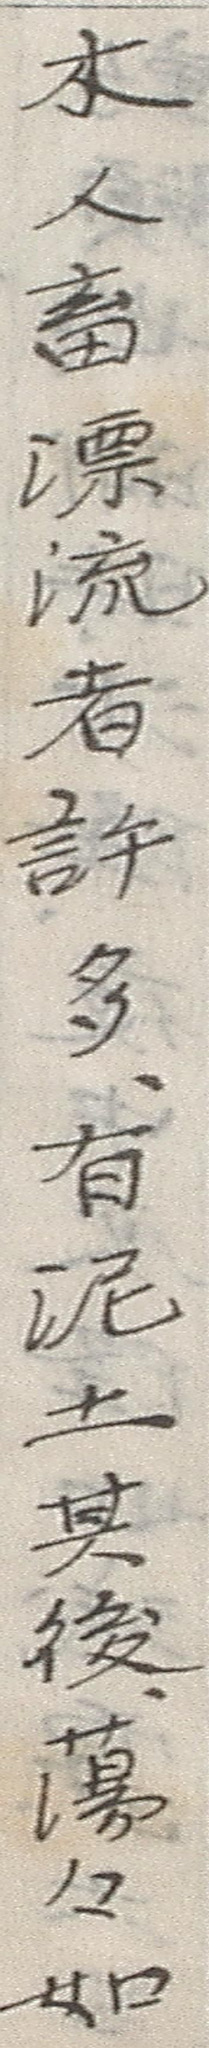木人畜漂流者許多、有泥土其後、蕩々如
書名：天明三年癸卯六月　沙降記　［蕗原拾続巻之五十二］
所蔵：東京大学地震研究所図書室 Earthquake Research Institute Library, The University of Tokyo, JAPAN
